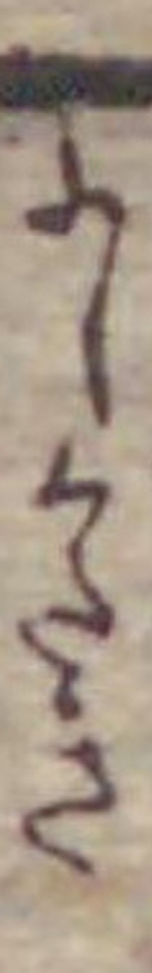ふしかたき
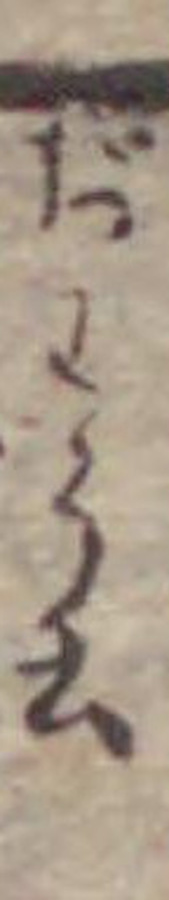ぢわう土
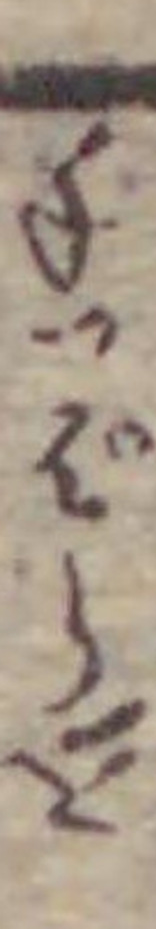手っばらを
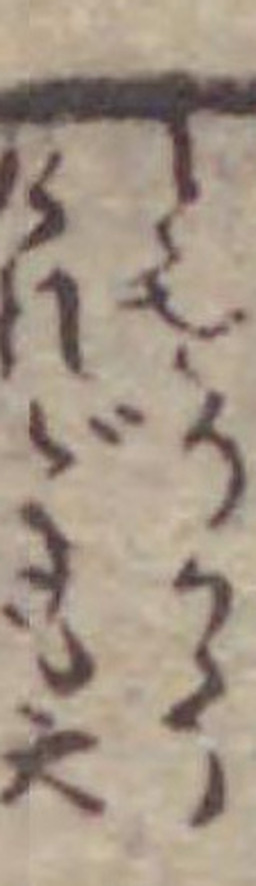けれども大
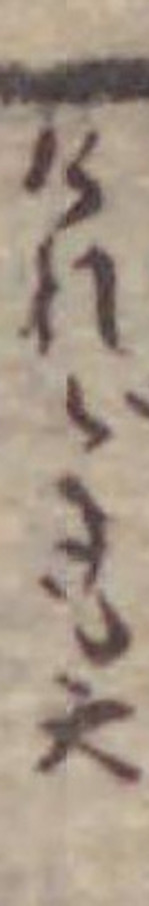けれども大
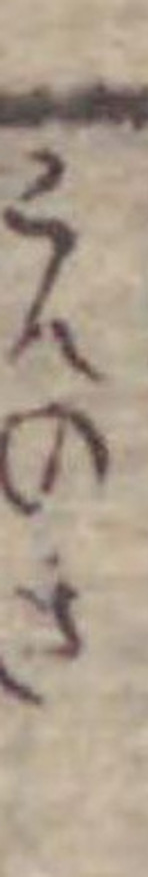こんのき
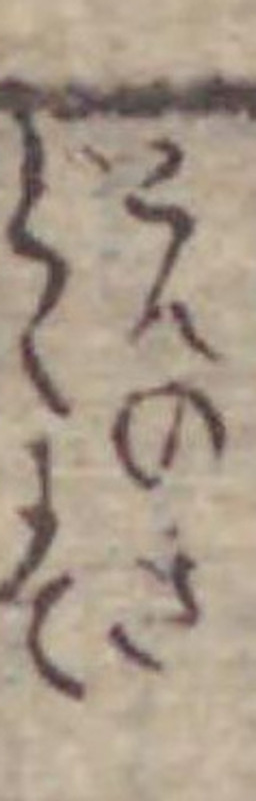どくにて
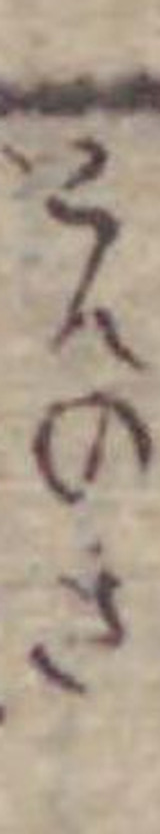こんのき
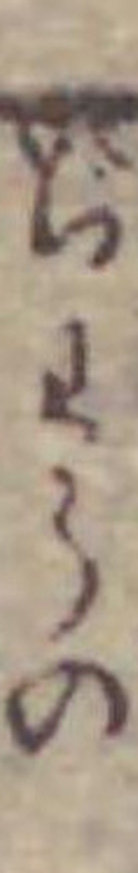ぢわうの
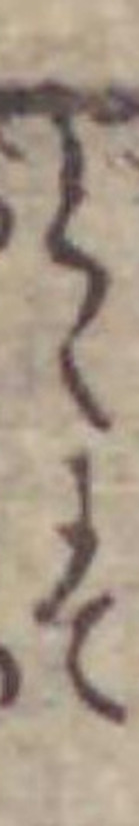どくにて
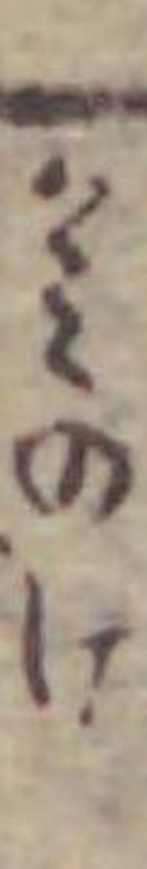かみのけ
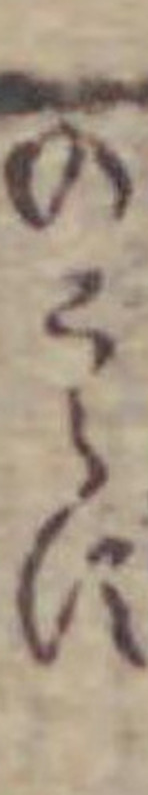のこらず
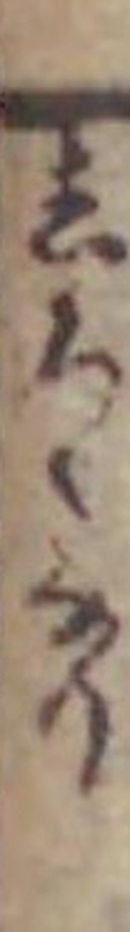しろくなり
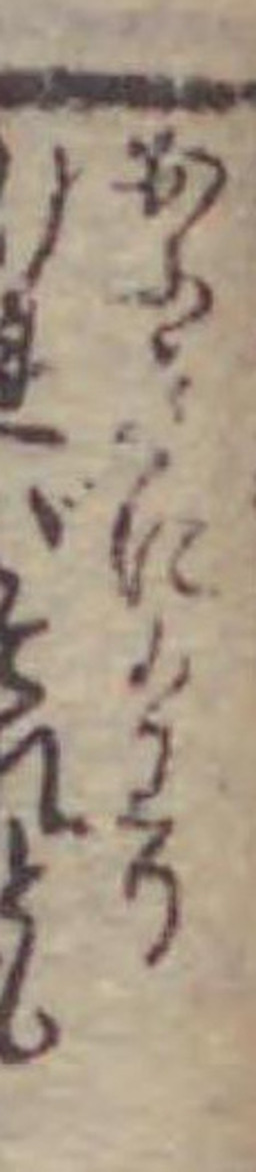ければそれとも
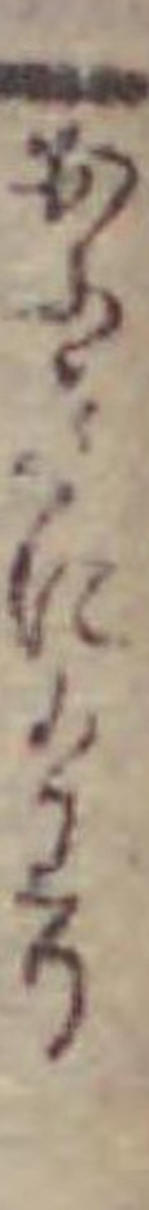おふきにかわり
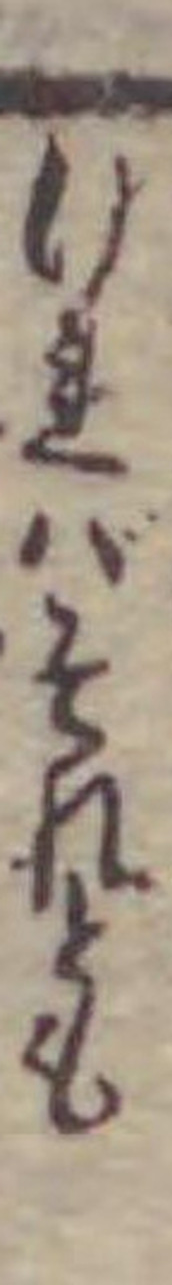ければそれとも
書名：鼻下長生薬 : 3巻
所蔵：国立国会図書館 National Diet Library, JAPAN
